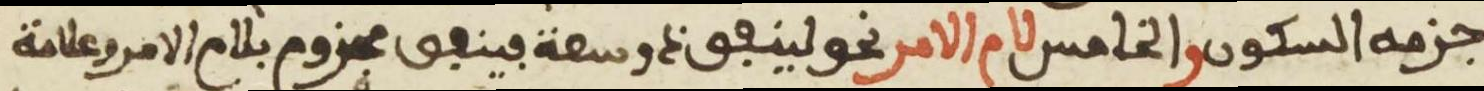جزمه السكون و الخامس لام الامر نحو لينفق ذو سعة فينفق مجزوم بلام الامر و علامة
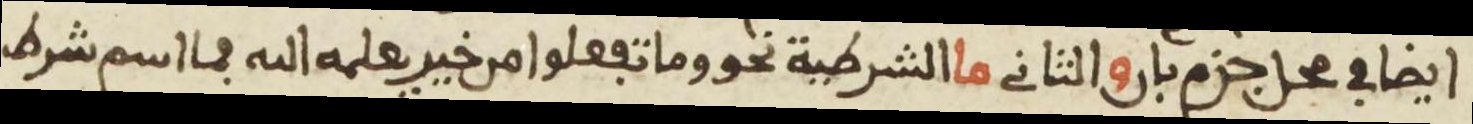ايضا في محل جزم بان و الثاني ما الشرطية نحو و ما تفعلوا من خير يعلمه الله فما اسم شرط
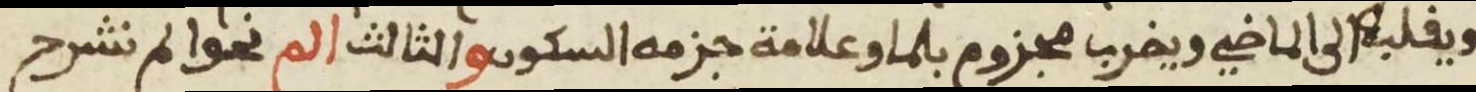و يقلبه الى الماضي و يضرب مجزوم بلما و علامة جزمه السكون و الثالث الم نحو الم نشرح
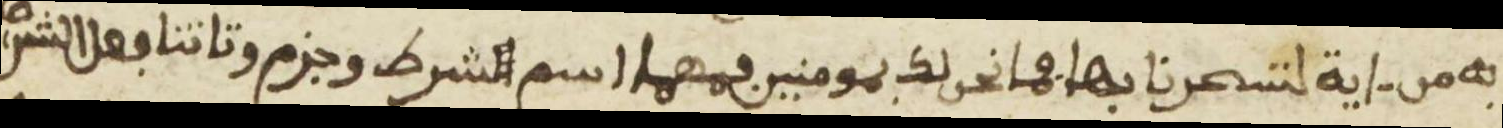به من ءاية لتسحرنا بها فما نحن لك بمومنين فمهما اسم شرط و جزم و تاتنا فعل الشرط
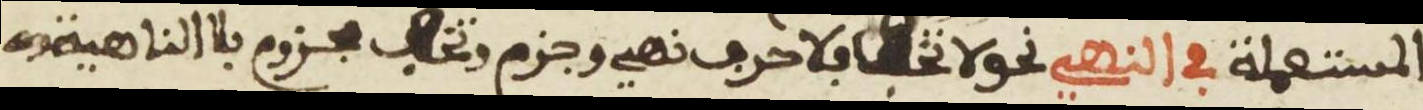المستعملة في النهي نحو لا ### فلا حرف نهي و جزم و تخف مجزوم بلا الناهية
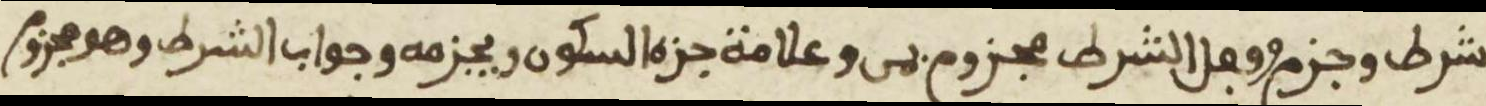شرط و جزم و فعل الشرط مجزوم بمن و علامة جزه السكون و يجزمه و جواب الشرط و هو مجزوم
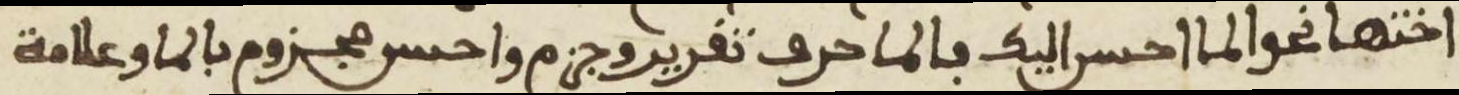اختها نحو الما احسن اليك فالما حرف تقرير و جزم و احسن مجزوم بالما و علامة
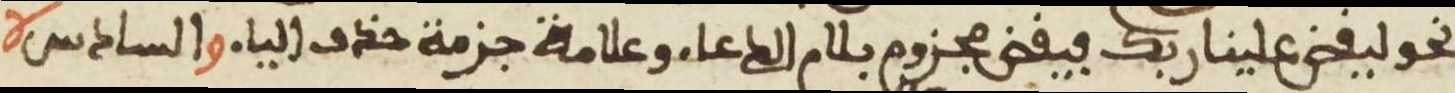نحو ليقض علينا ربك فيقض مجزوم بلام الدعاء و علامة جزمة حذف الياء و السادس لا
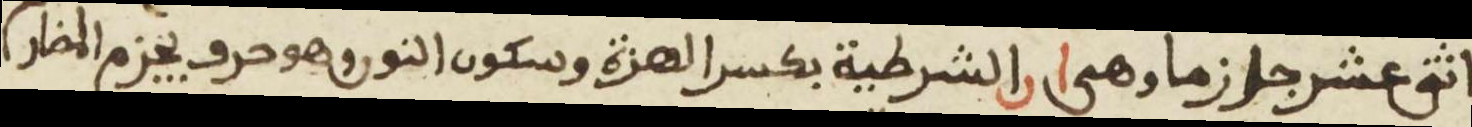اثنى عشر جازما و هى ان الشرطية بكسر الهزة و سكون النون و هو حرف يجزم المضارع
